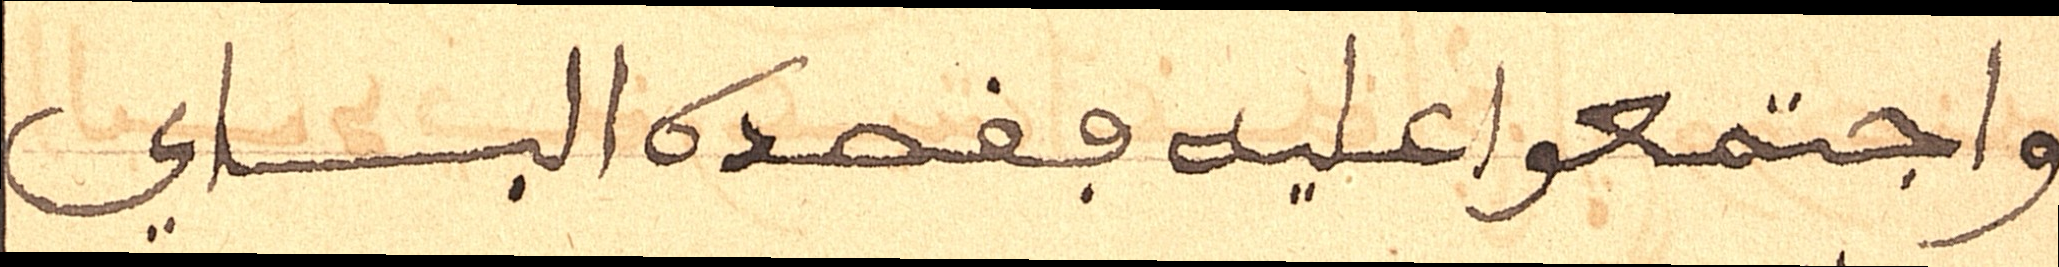واجتمعوا عليه فقصده الباي
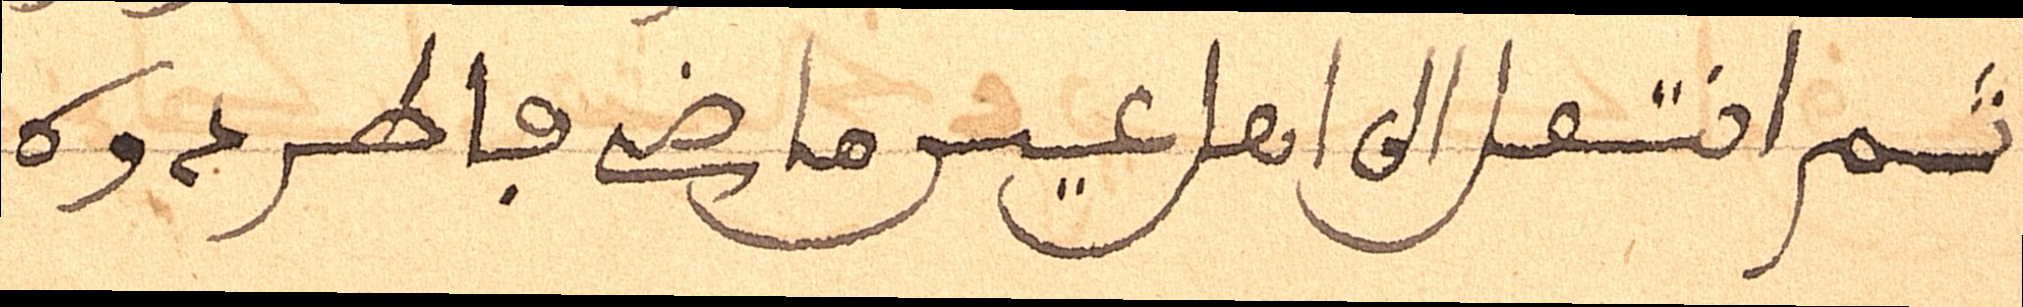ثم انتقل الى اهل غير ماضى فاطردوه
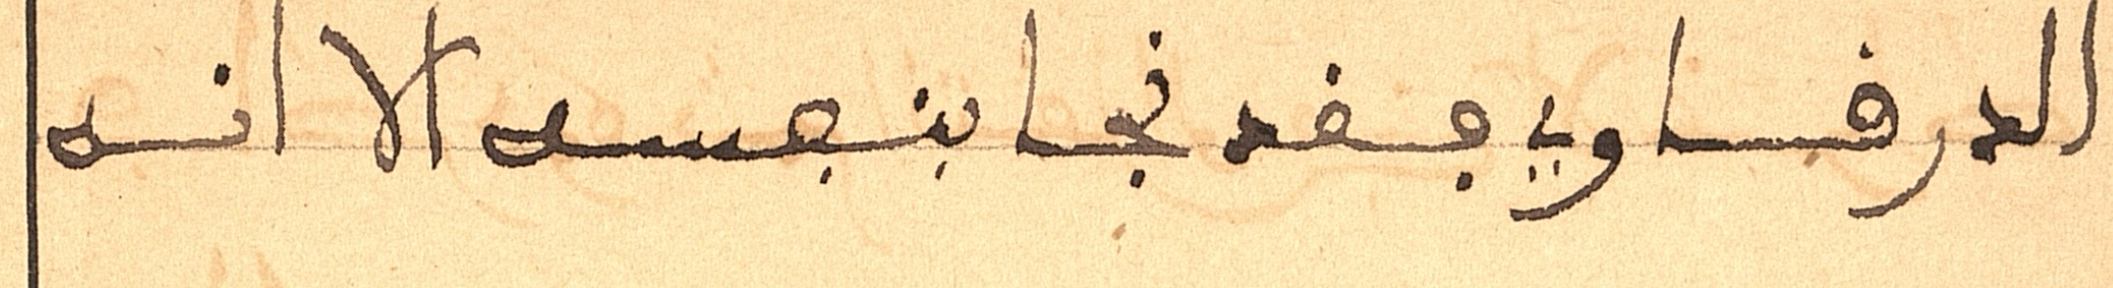الدرقاوي فقد نجا بنفسه الا انه
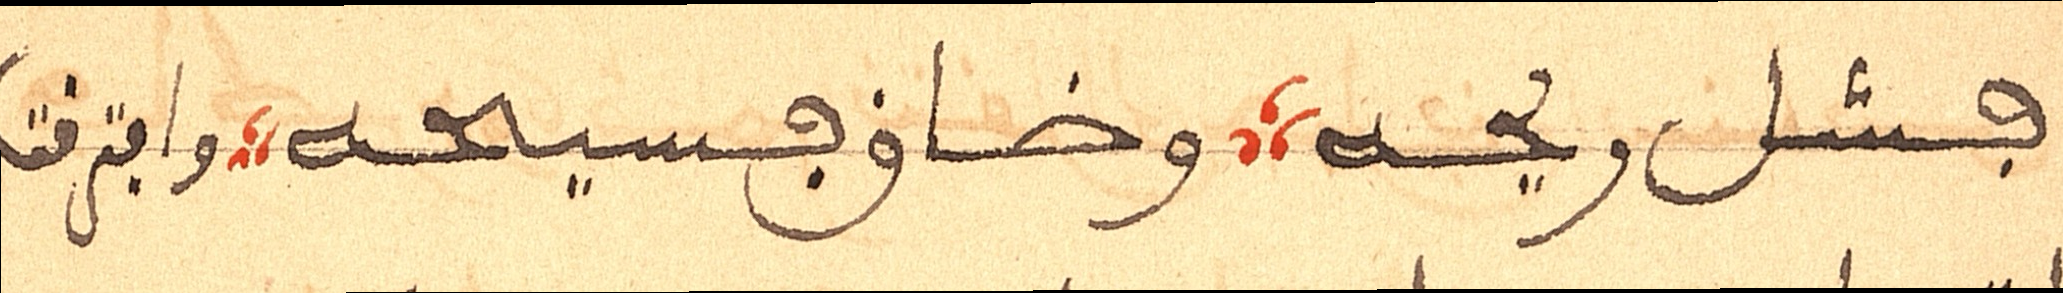فشل ريحه وضاق فسيحه وافترقت
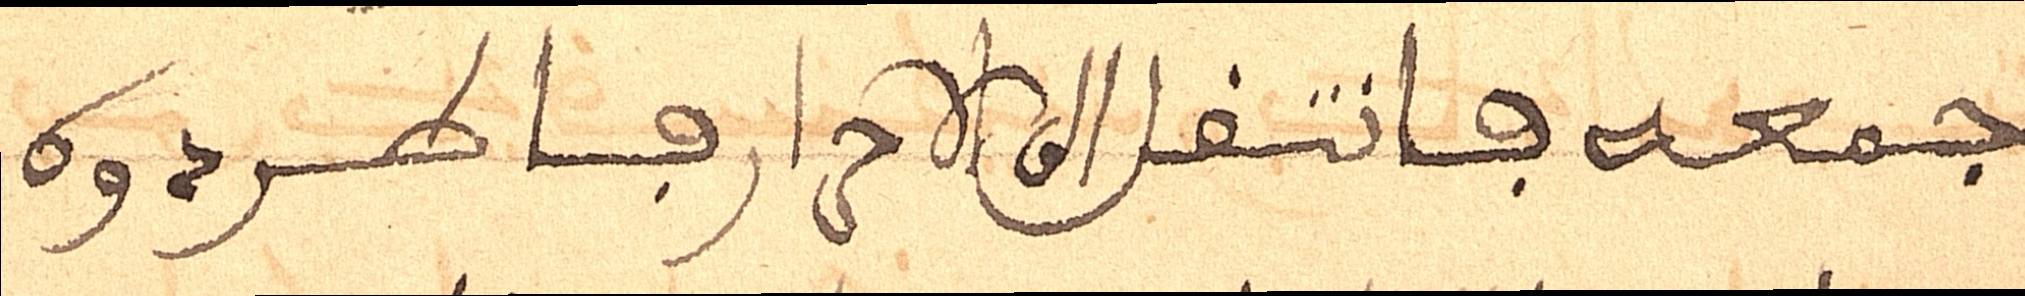جمعه فانتقل الى الاحرار فاطردوه
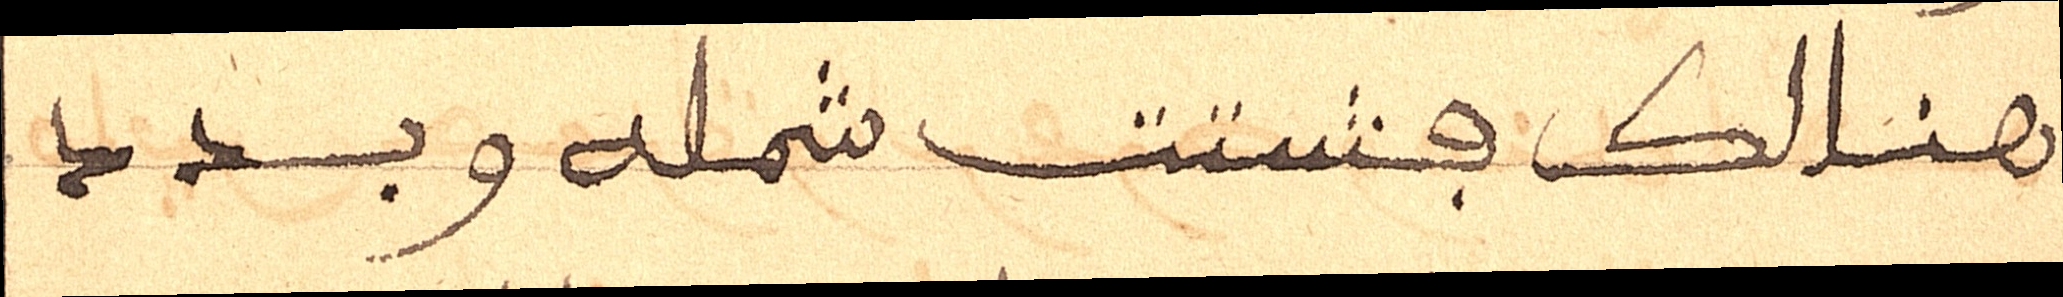هنالك فشتت شملة وبدد
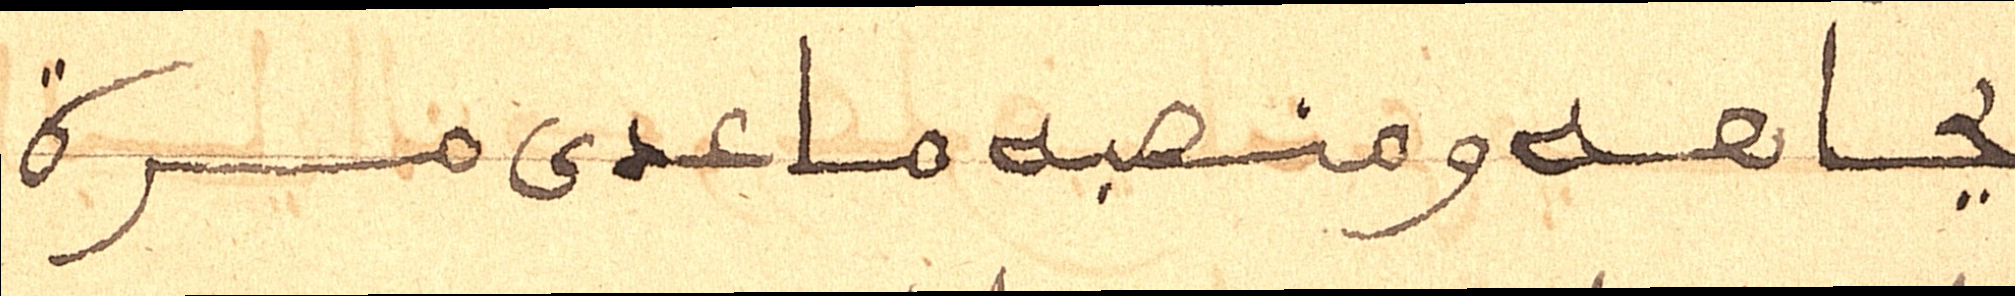يحاهه ومنصبه ما عدى مرة
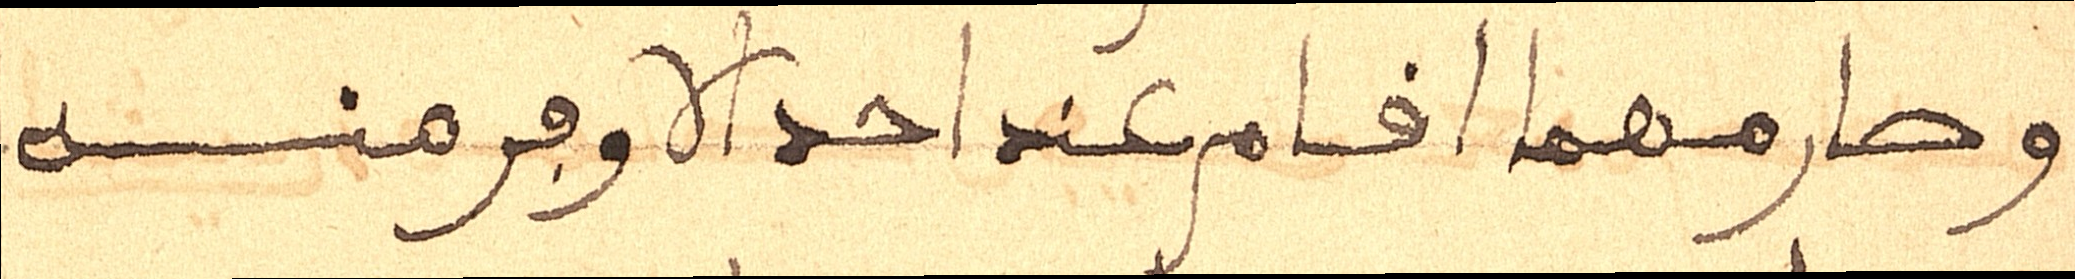وصار مهما اقام عنه احد الا وفر منه
